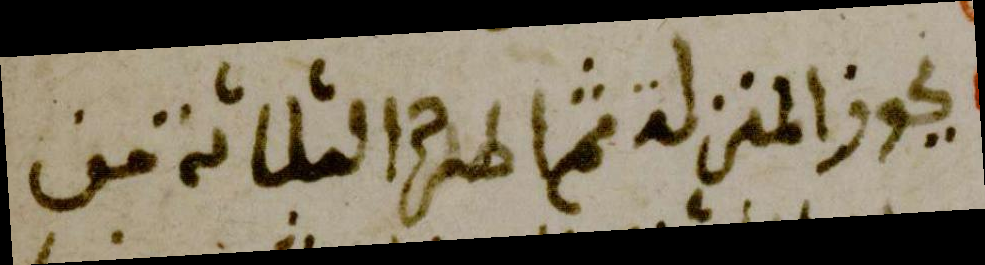يحوز المنزلة ثم اطرح الثلاثة من
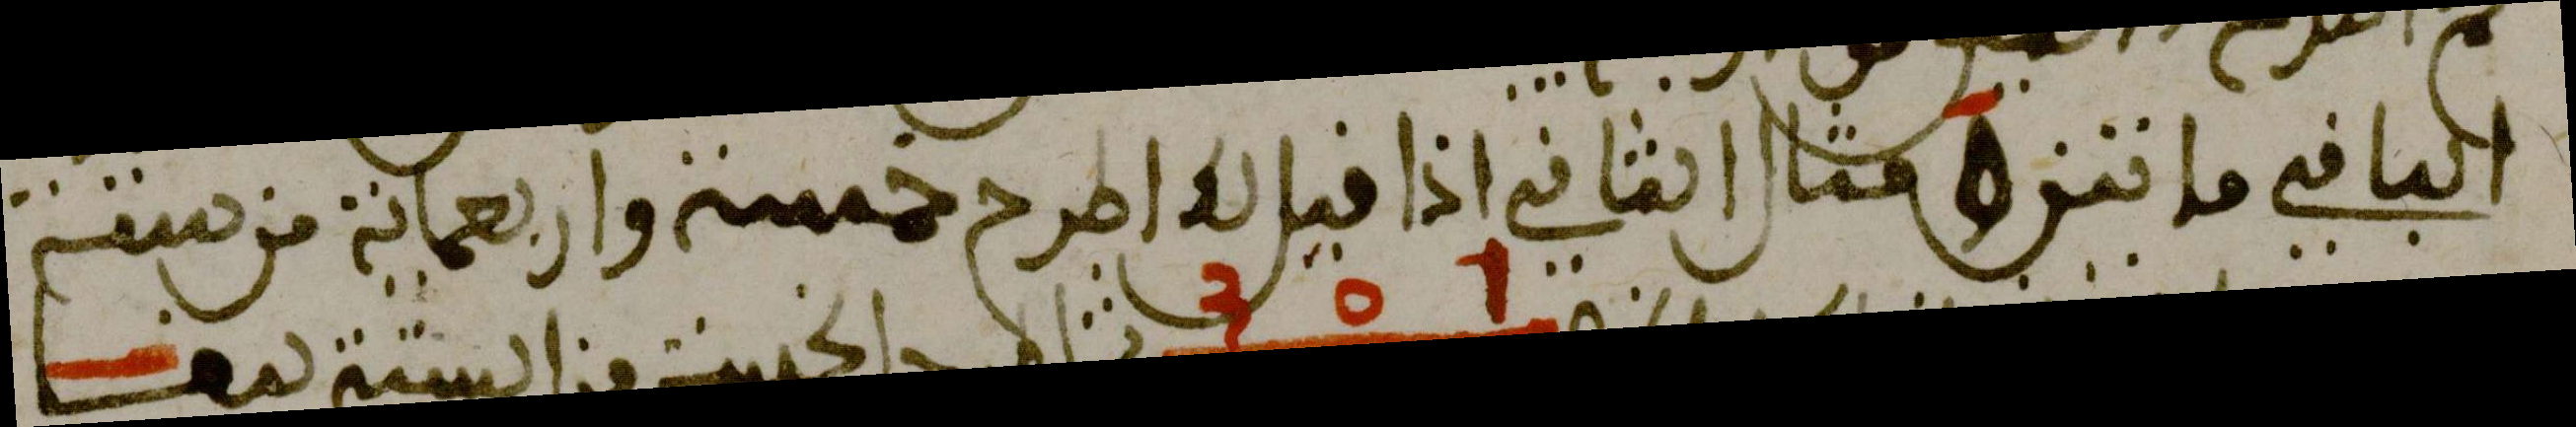الباقي ماتين ومثال الثاني اذا قيل لك اطرح خمسة واربعماية من ستة
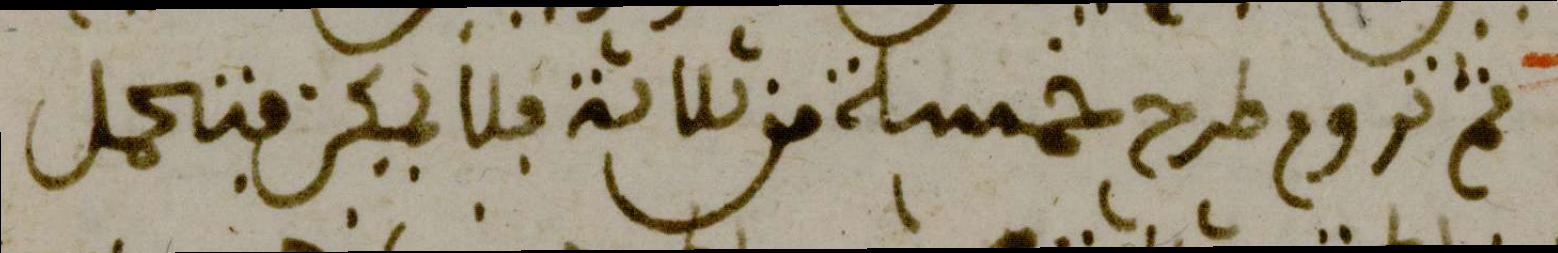ثم تروم طرح خمسة من ثلاثة فلا يمكن فتحمل
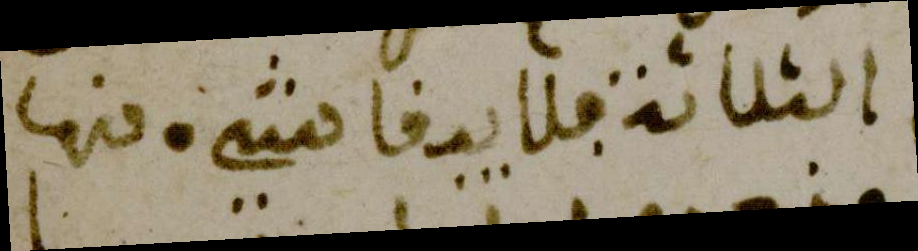الثلاثة فلا يبقا شيء منها
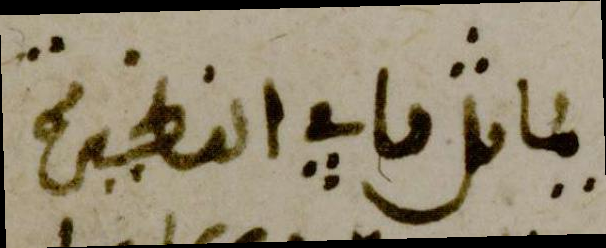يماثل ما في النظيرة
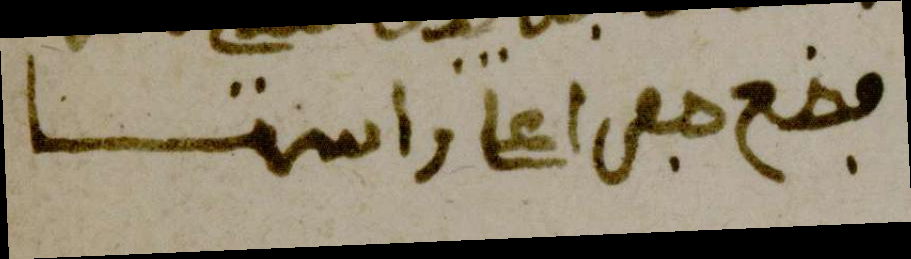فضع صفرا على راسها
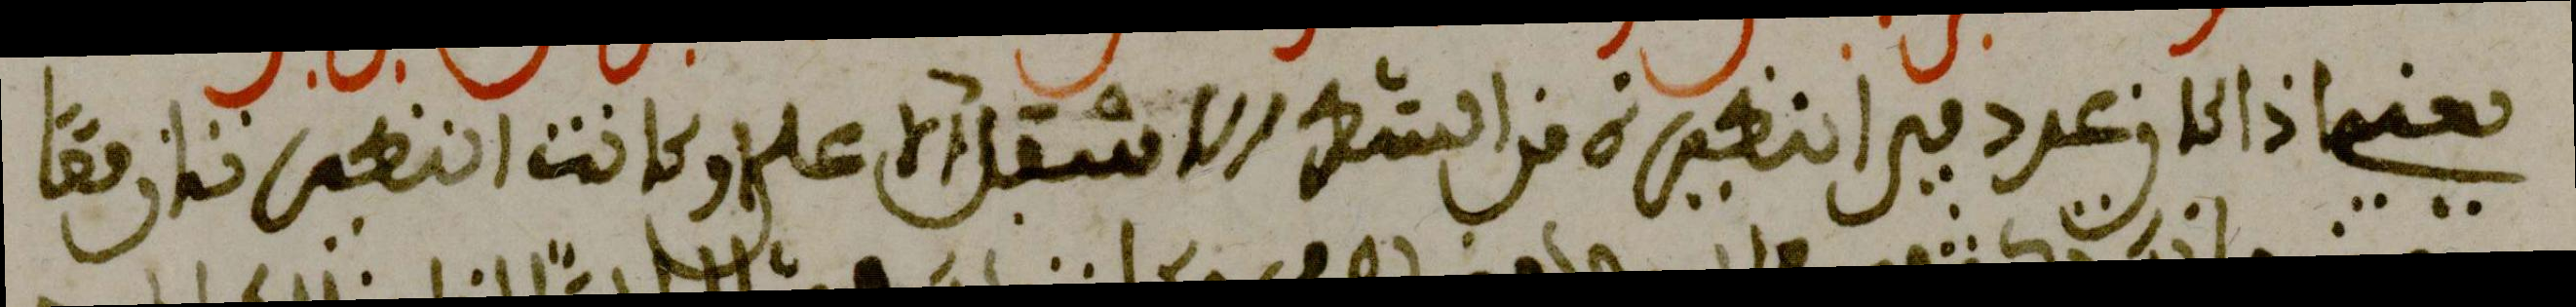يعني اذا كان عدد في النظيرة من السّطر الاسْفَل الا على وكانت النظيرتان معًا
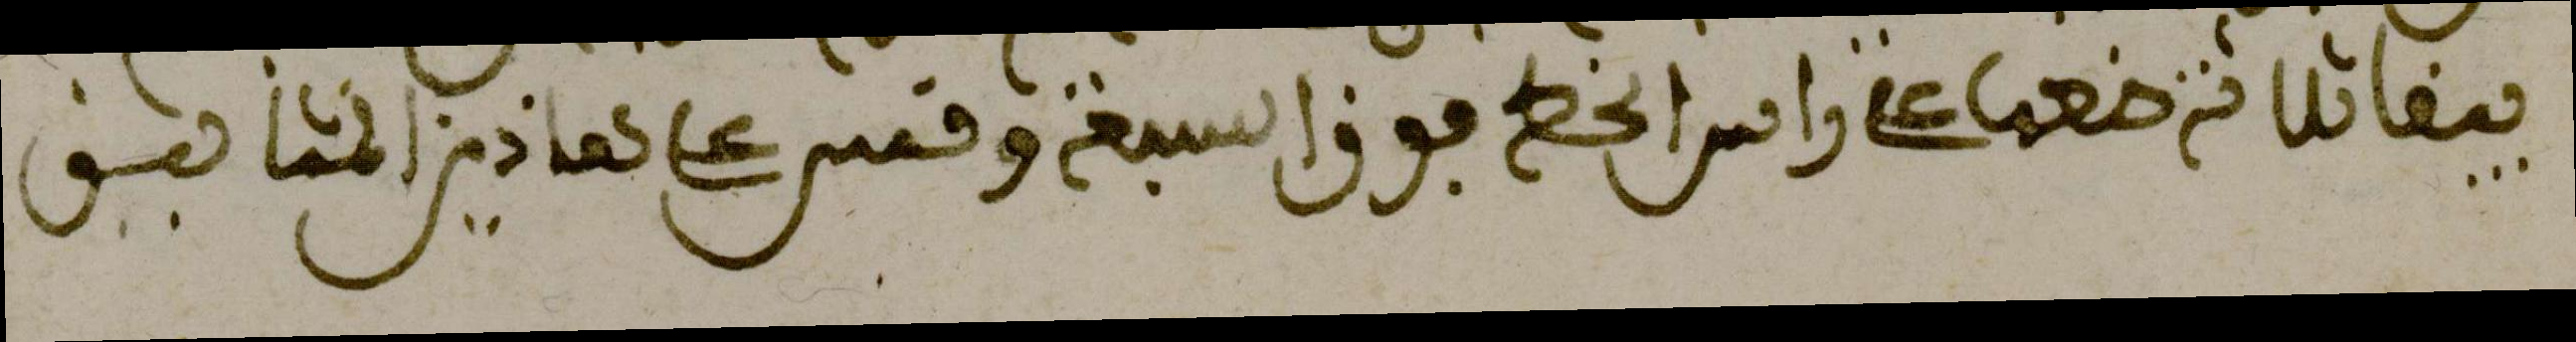يبقا ثلاثة ضعها على راس الخط فوق السبعة وقس على هاذين المثالين
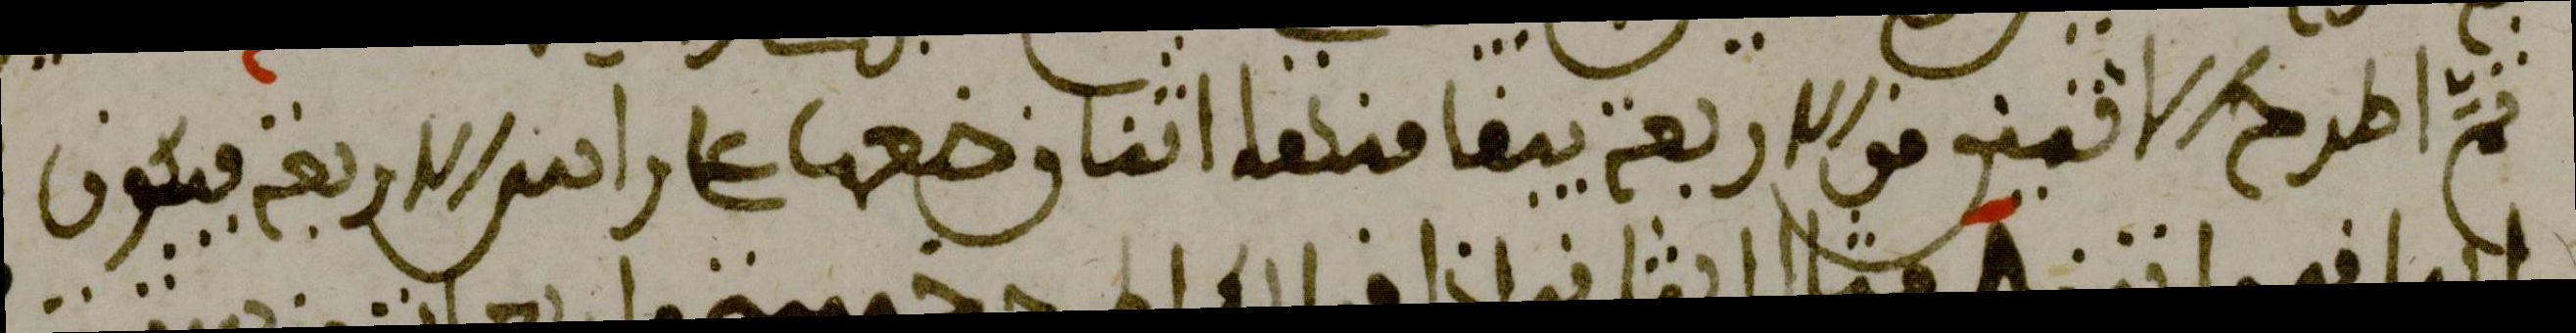ثمّ اطرح الاثنين من الاربعة يبقا منها اثنان ضعها على راس الاربعة فيكون
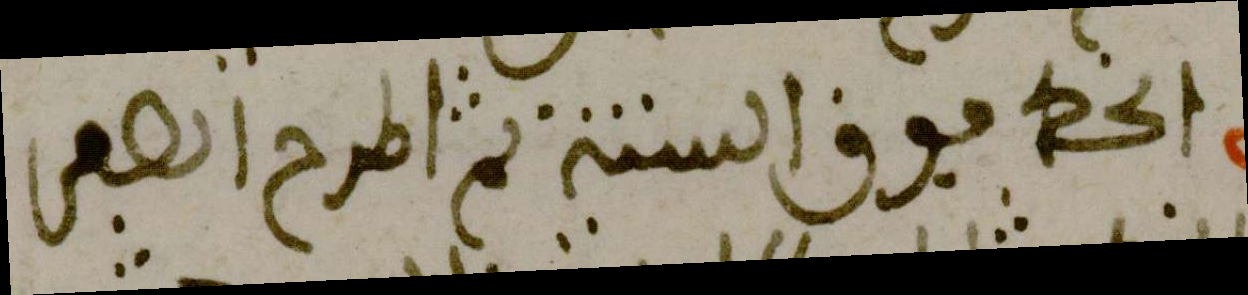الخط فوق الستة ثم اطرح الصفر
